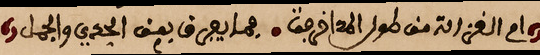ام الغزالة من طول المدا خرفت فما يفرق بين الجدي والجمل
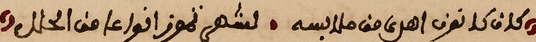كان كانون اهدى من ملابسه لشهر تموز انواعا من الحلل
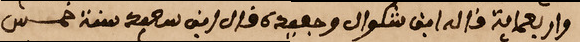واربعماية قاله ابن شكوال وحفيده قال ابن سعيد سنة خمس
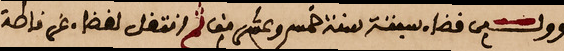وولي قضاء سبتة سنة خمس وعشرين من ثم انتقل لقضاء غرناطة
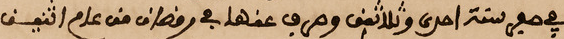في صفر سنة احدى وثلاثين وصرف عنها في رمضان من عام اثنين
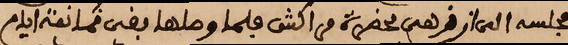مجلسه الى ان زهى بحضرة مراكش فلما وصلها بقي ثمانية ايام
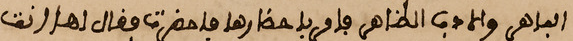الباهر والادب الظاهر فامر باحضارها فاحضرت فقال لها انت
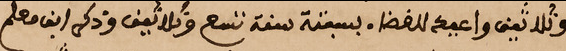وثلاثين واعيد للقضاء بسبتة سنة تسع وثلاثين وذكر ابن معلم
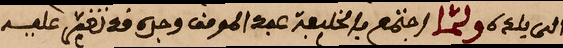الى بلده ولما اجتمع بالخليفة عبد المومن وجده قد تغير عليه
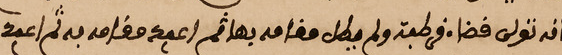انه تولى قضاء قرطبة ولم يطل مقامه بها ثم اعيد مقامه به ثم اعيد
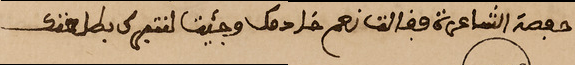حفصة الشاعرة فقالت نعم خادمك وجيت لنتبرك بطلعتك
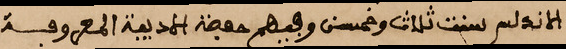الاندلس سنت ثلاث وخمسين وفيهم حفصة الاديبة المعروفة
